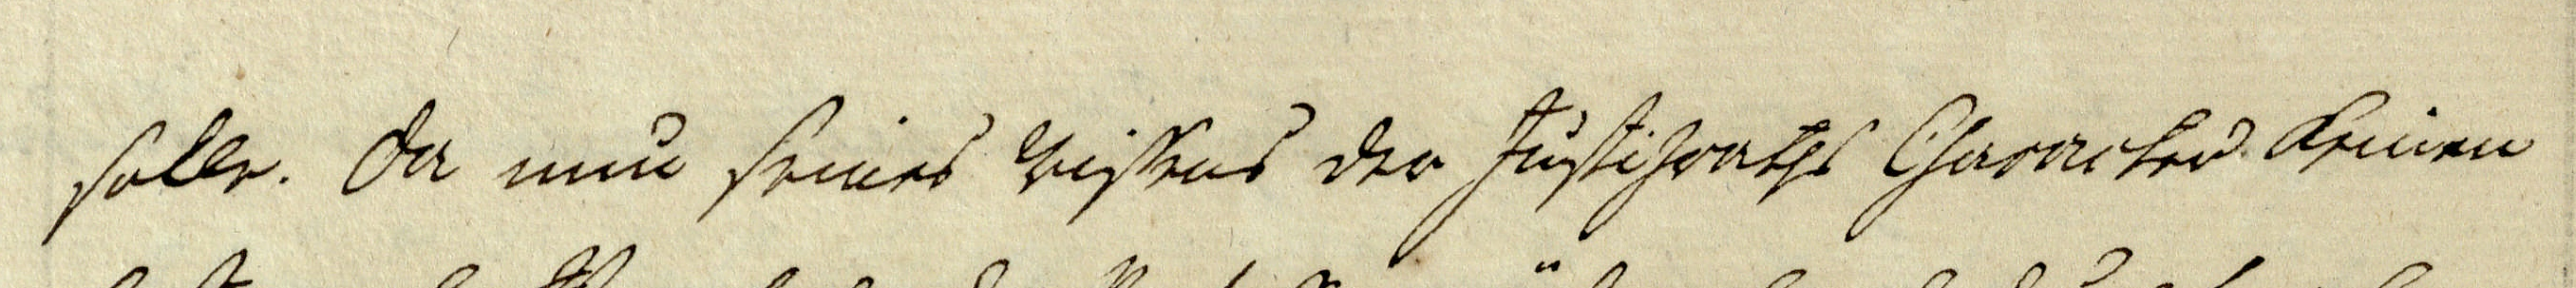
solle. Da nun seines Wissens der Justizraths Character keinen
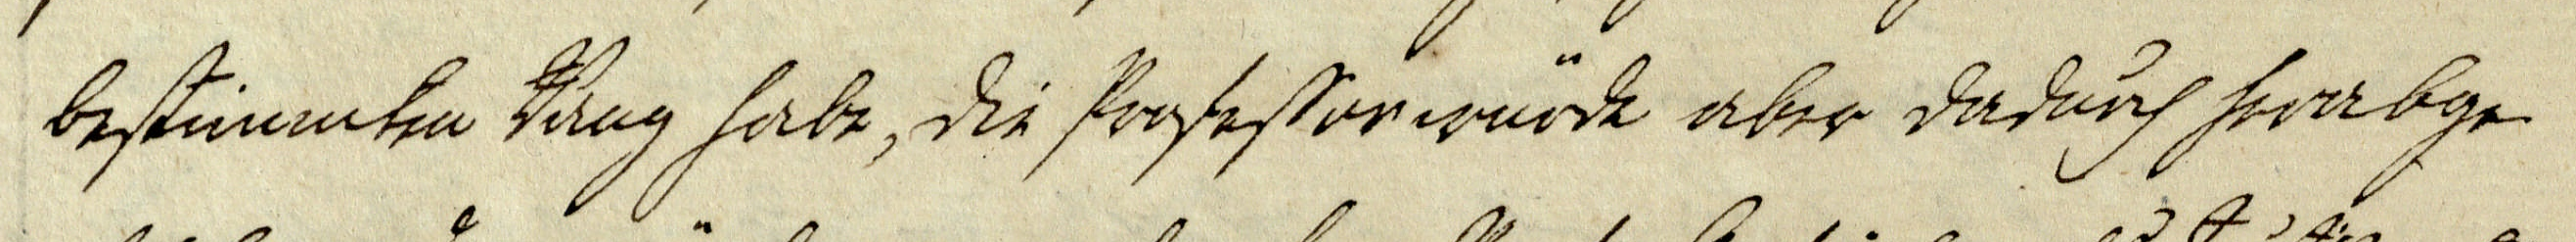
bestimmten Rang habe, die Professorwürde aber dadurch herabge¬
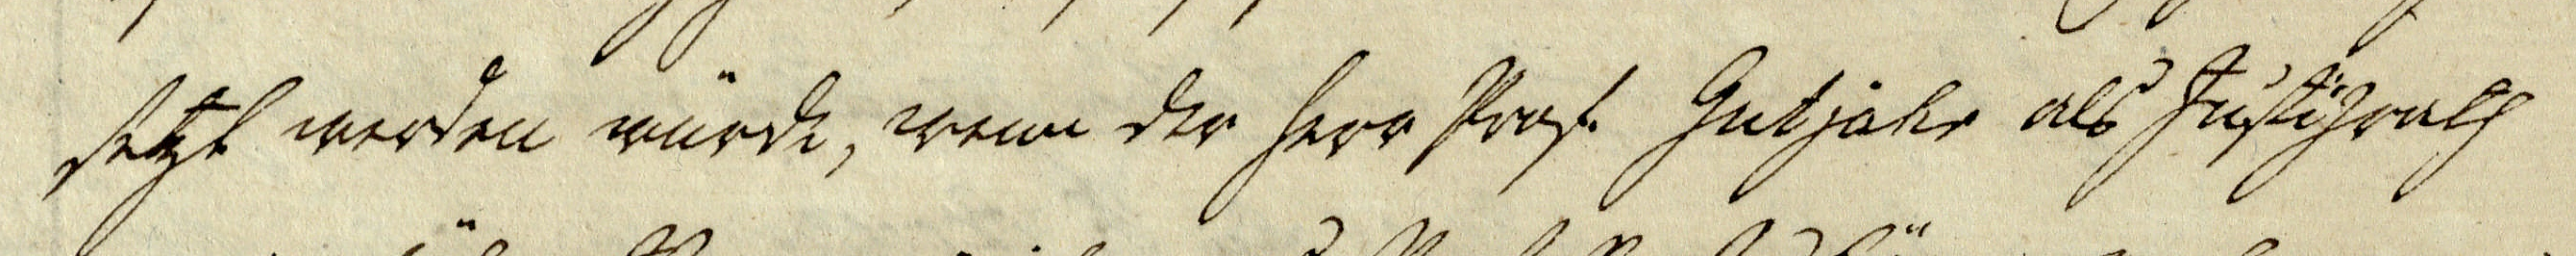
setzt werden würde, wenn der Herr Prof. Gutjahr als Justizrath
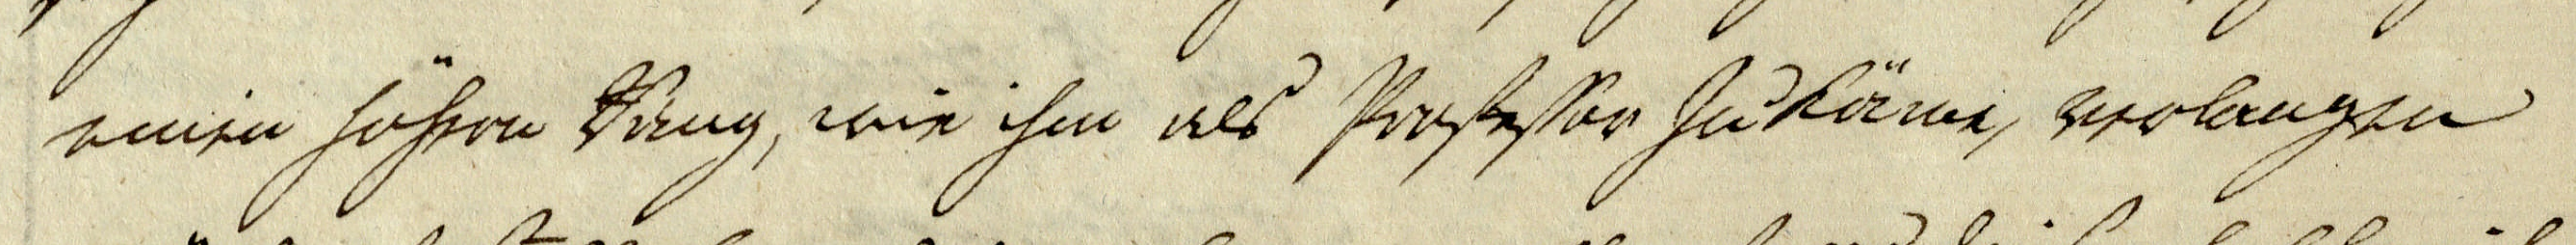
einen höhern Rang, wie ihm als Professor zukäme, verlangen
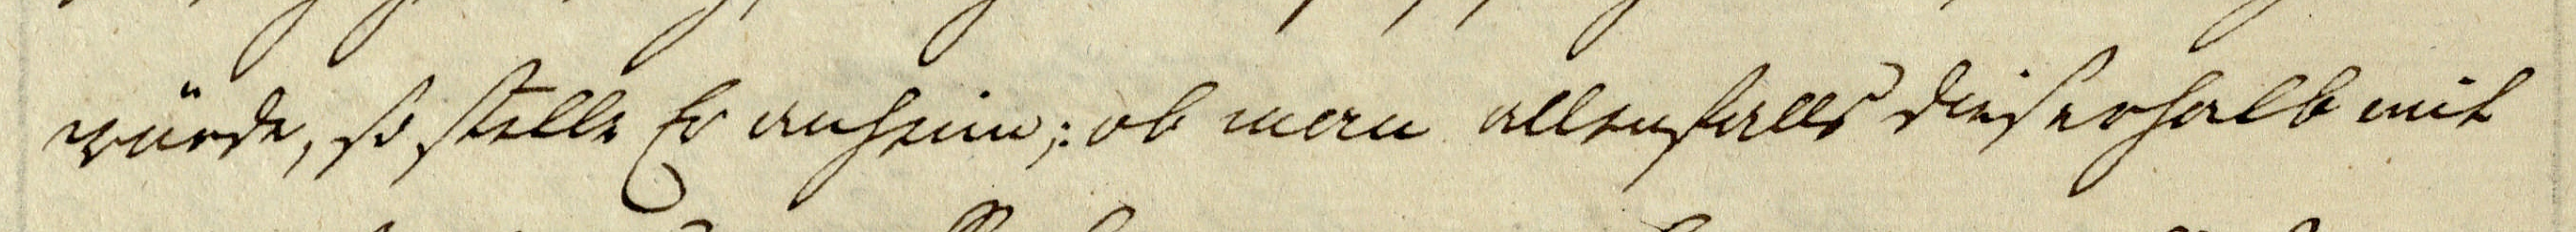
würde, so stelle Er anheim, ob man allenfalls dieserhalb mit
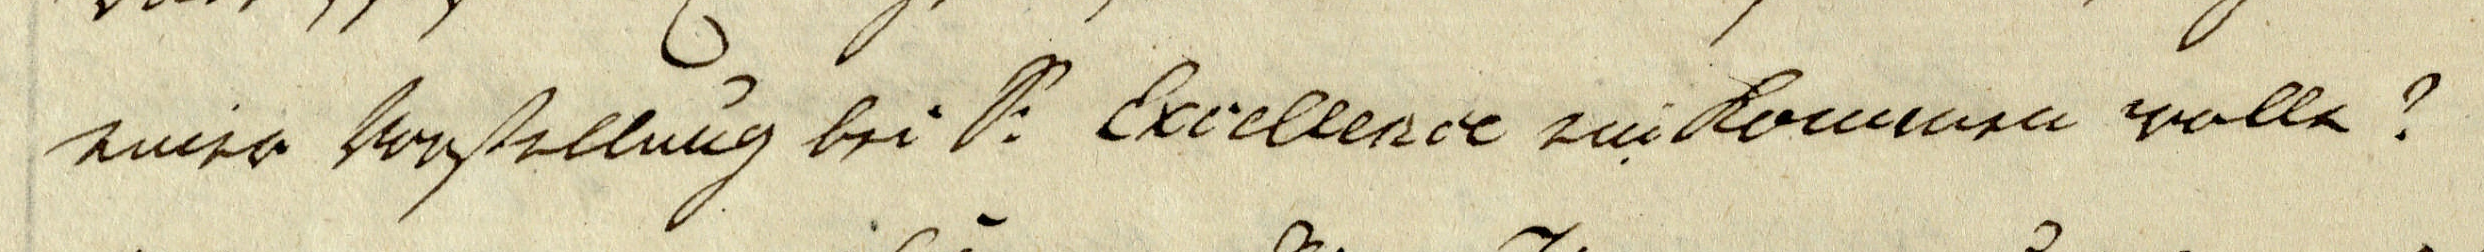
einer Vorstellung bei Sr Excellence einkommen wolle?
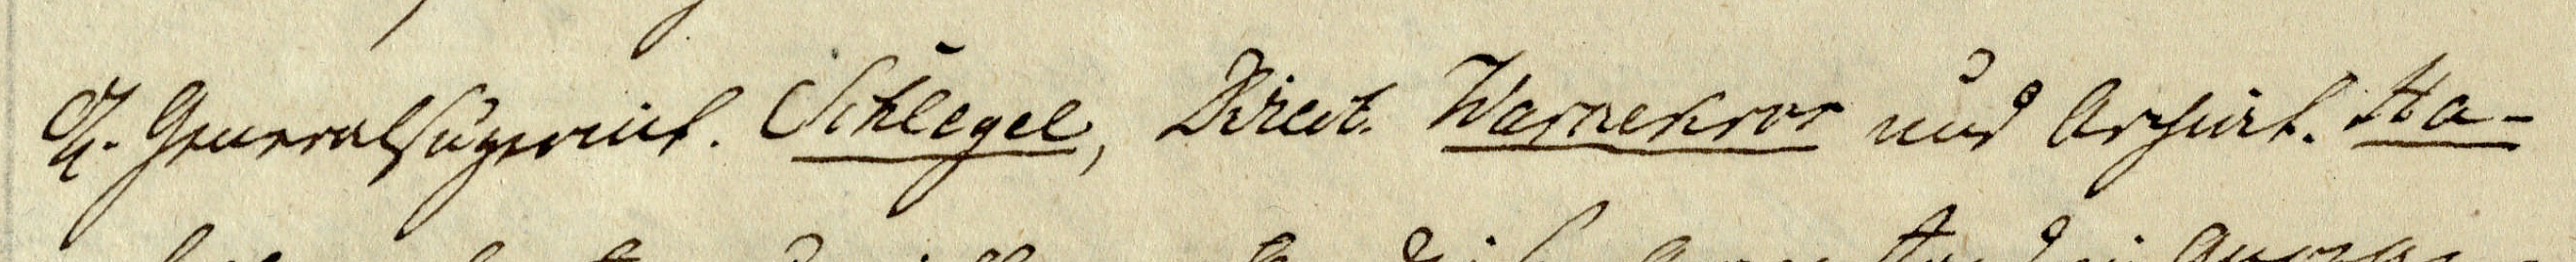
dh. Generalsuperint. Schlegel, Direct. Warnekros und Archiat. Ha¬
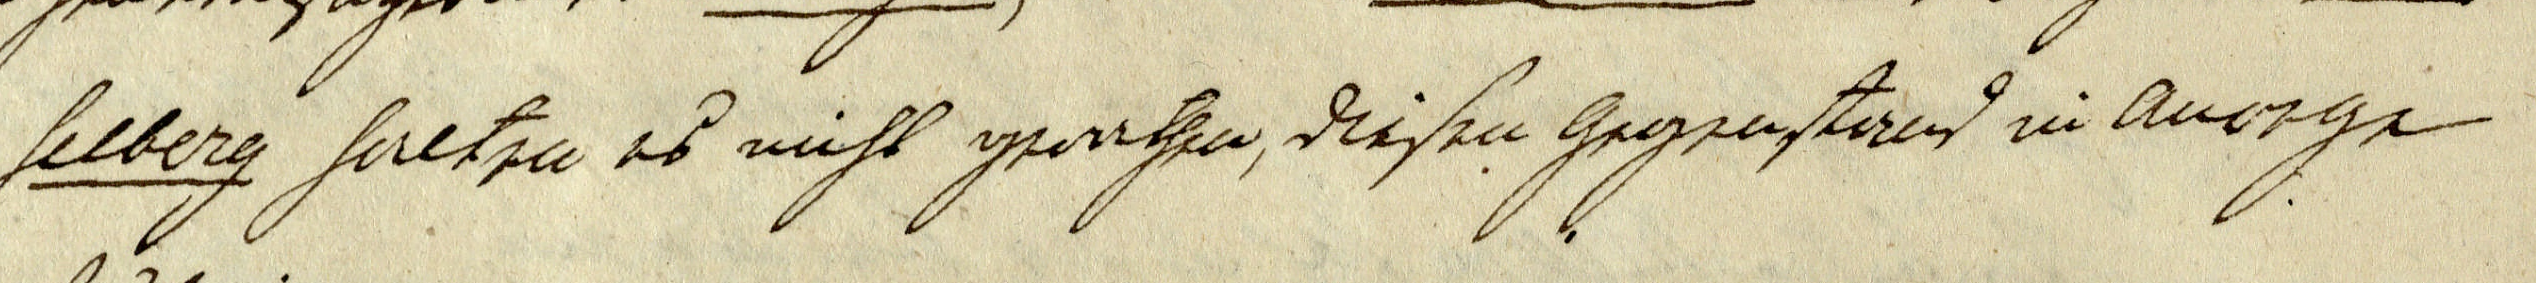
selberg halten es nicht gerathen, diesen Gegenstand in Anrege
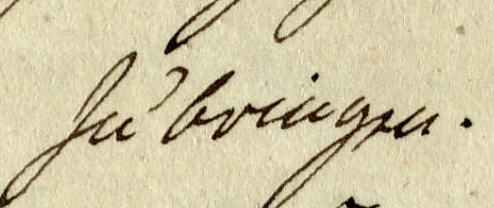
zu bringen.
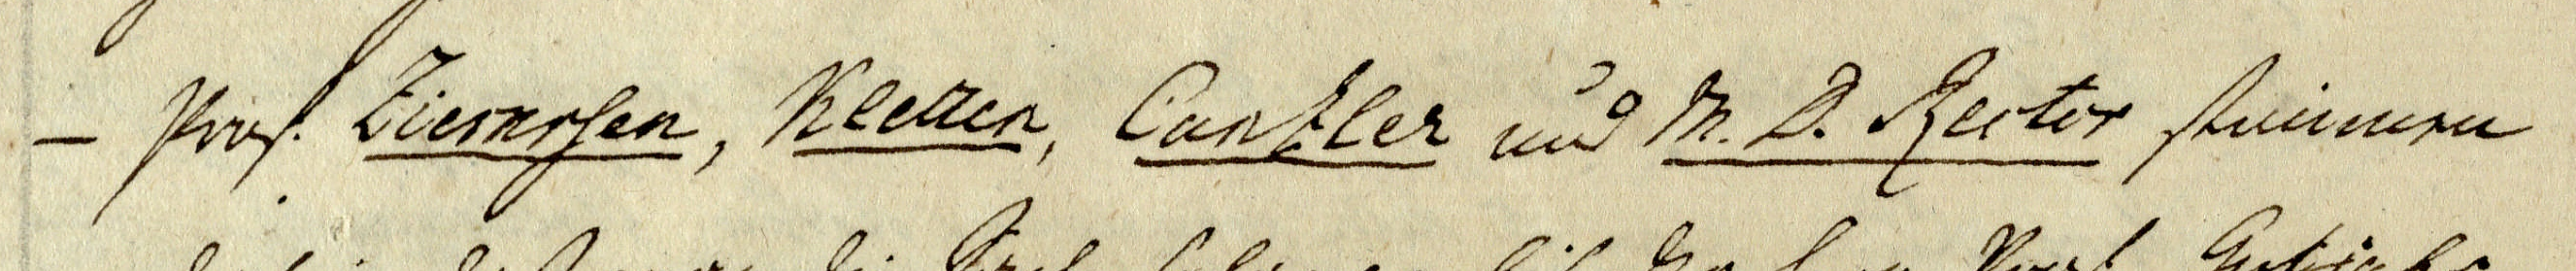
Prof. Ziemssen, Kletten, Canzler und M. D. Rector stimmen
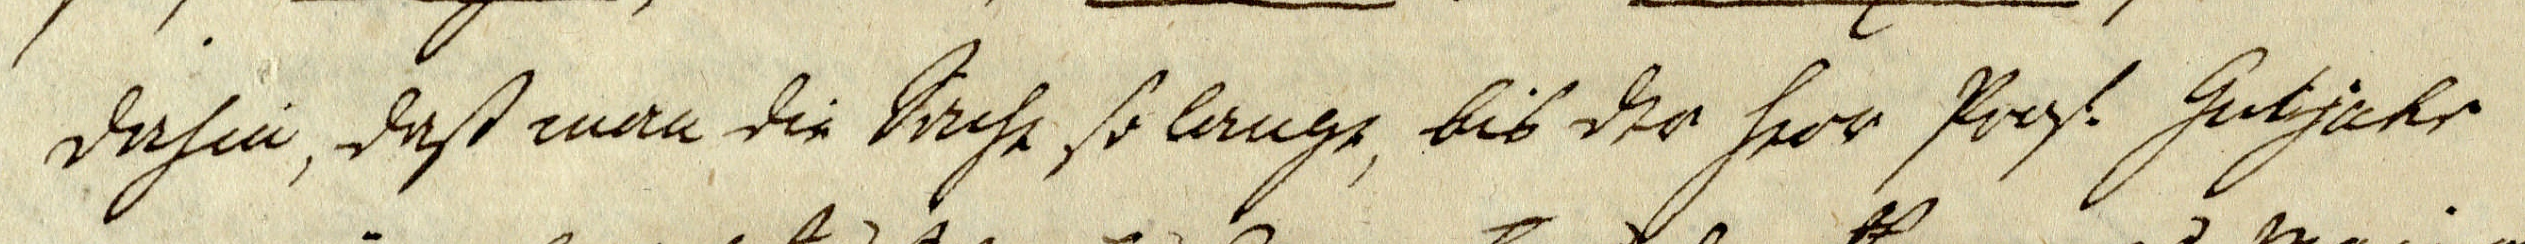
dahin, daß man die Sache so lange, bis der Herr Prof. Gutjahr
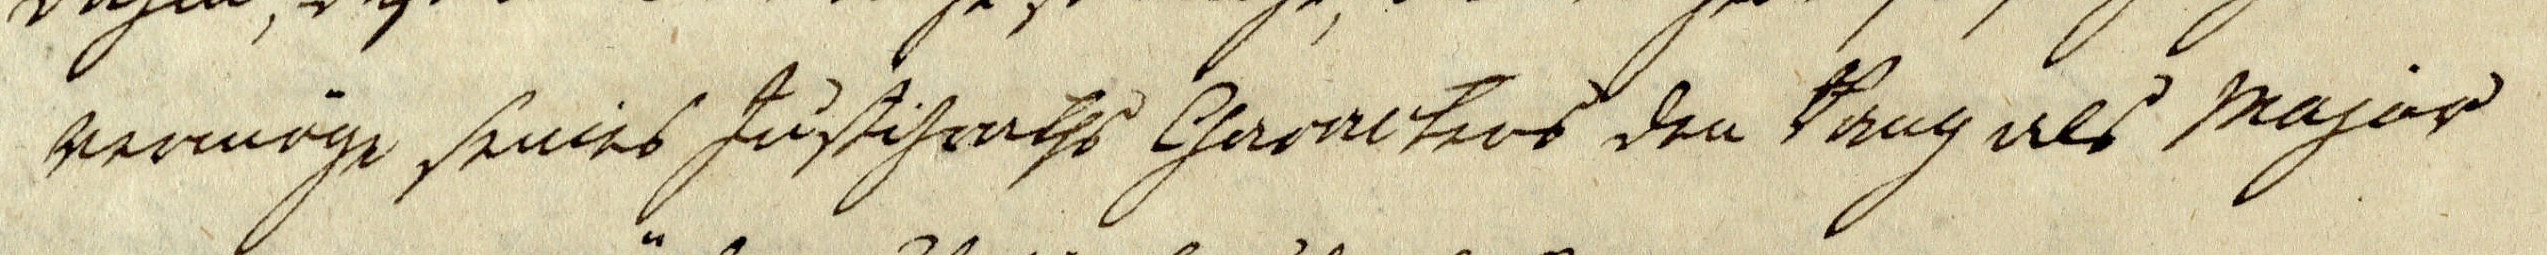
vermöge seines Justizraths Charackters den Rang als Major
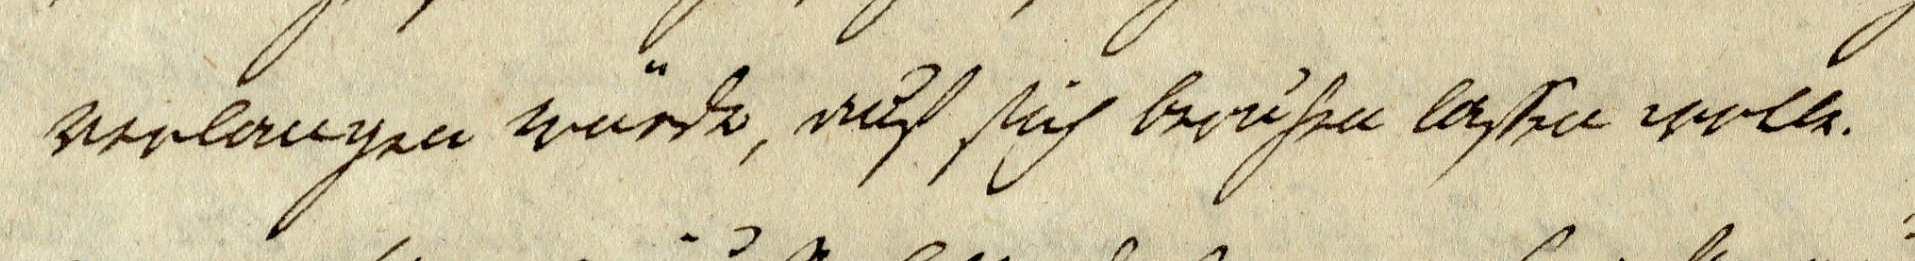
verlangen würde, auf sich beruhen lassen wolle.
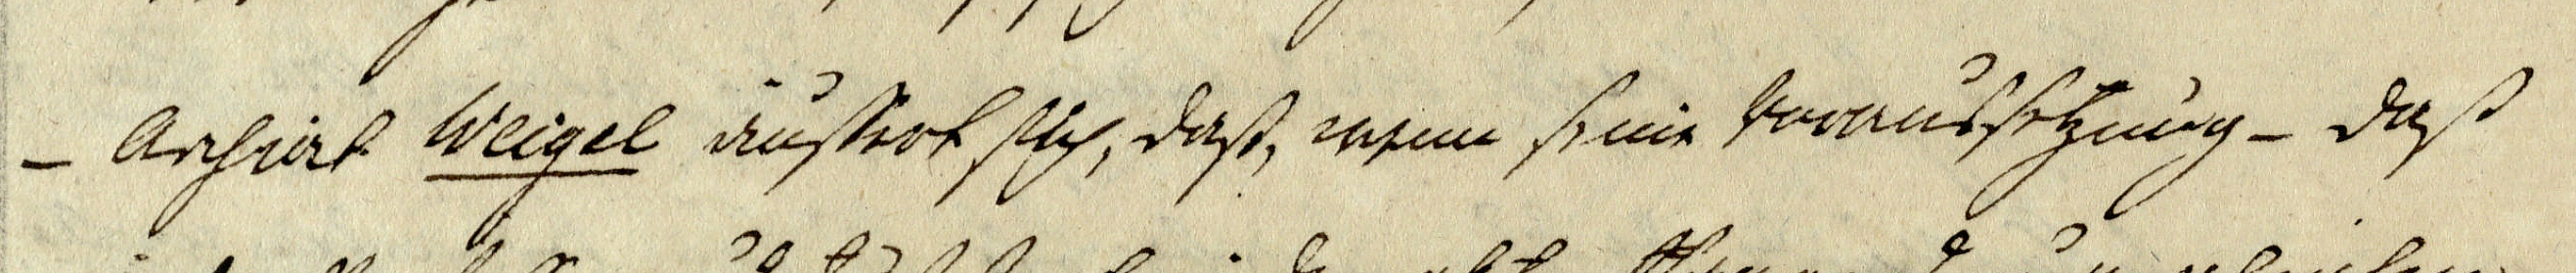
Archiat. Weigel äussert sich, daß, wenn seine Voraussetzung - daß
